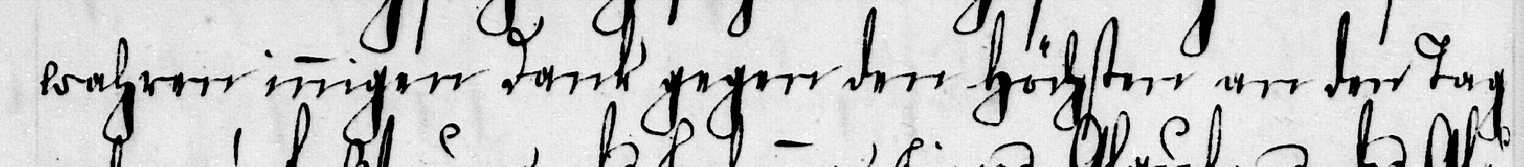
wahren innigen Dank gegen den Höchsten an den Tag
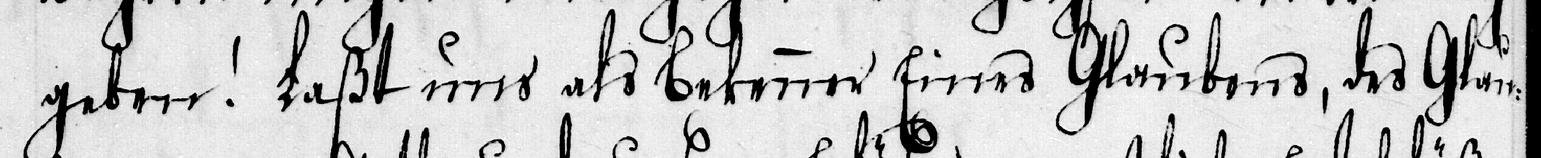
geben! Laßt uns als Bekenner Eines Glaubens, des Glau¬
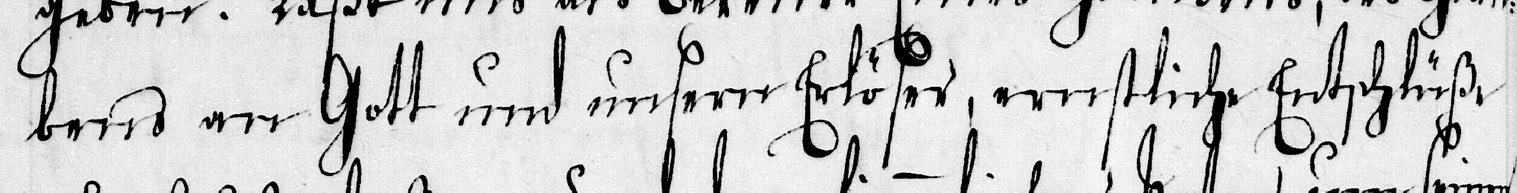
bens an Gott und unsern Erlöser, ernstliche Entschlüße
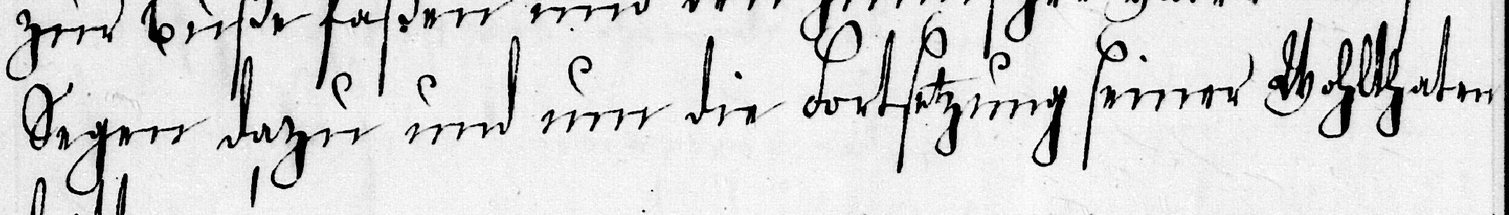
Segen dazu und um die Forsetzung seiner Wohlthaten
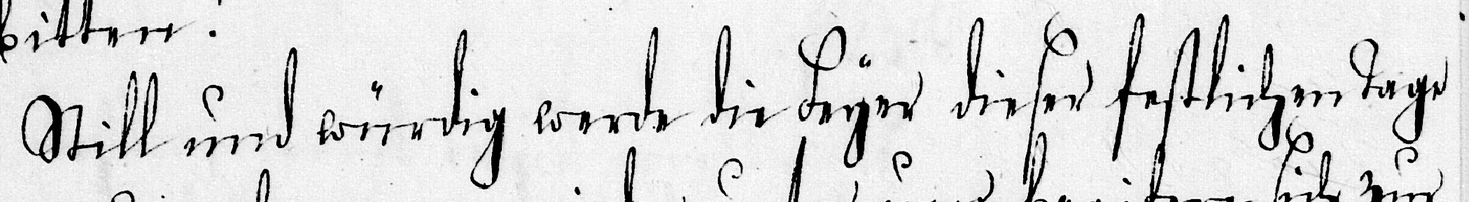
Still und würdig werde die Feyer dieser festlichen
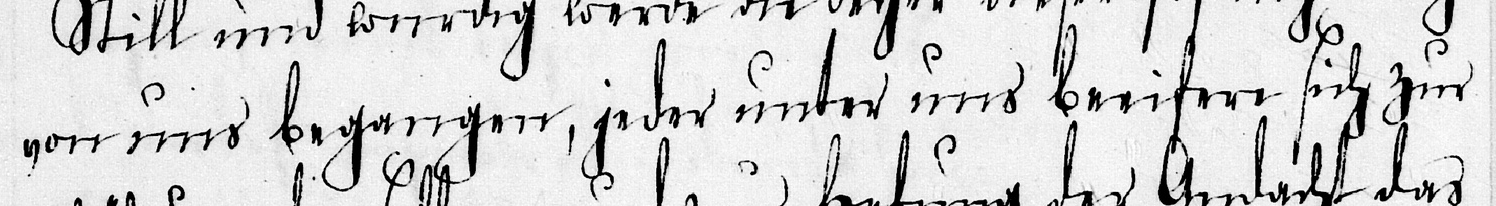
von uns begangen, jeder unter uns beeifere sich zur
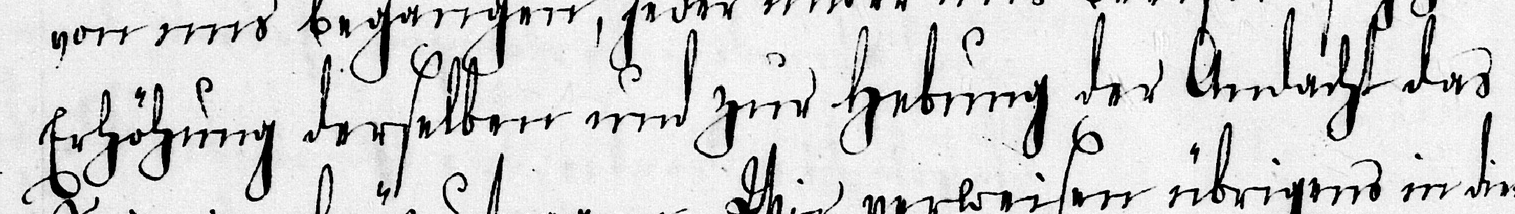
Erhöhung derselben und zur Hebung der Andacht das
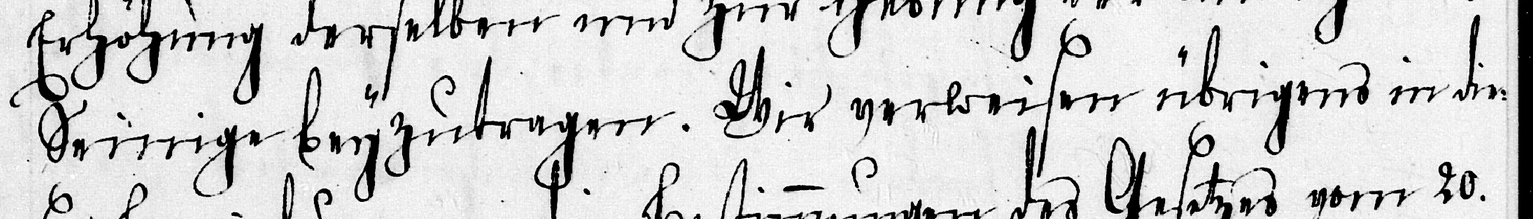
Seinige beyzutragen. Wir verweisen übrigens in die¬
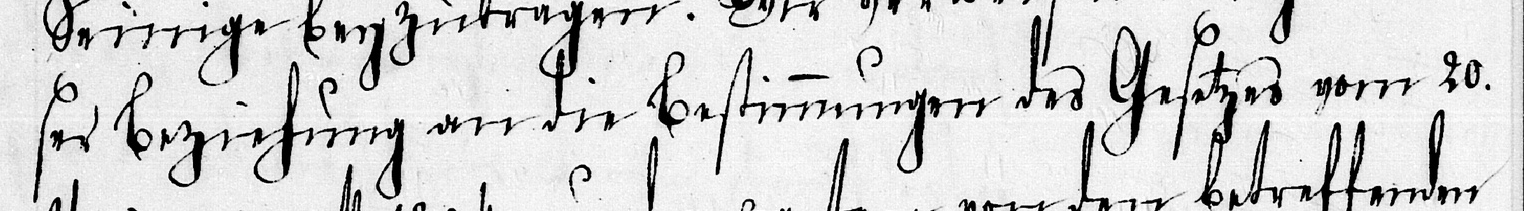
ser Bezeichnung an die Bestimmungen des Gesetzes vom 20.
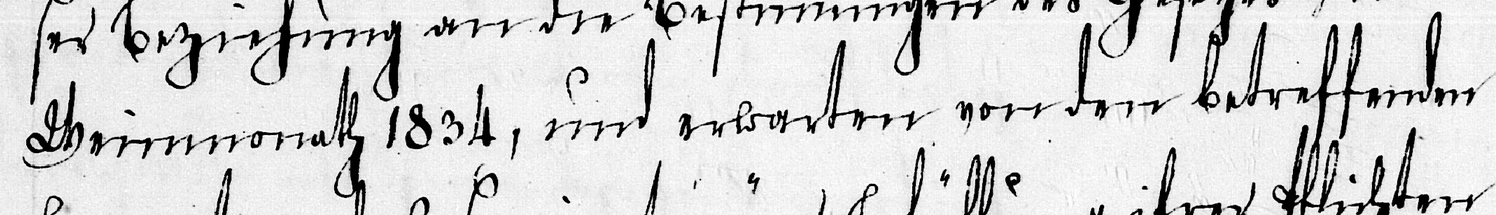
Weinmonath 1834, und erwarten von den betreffenden
